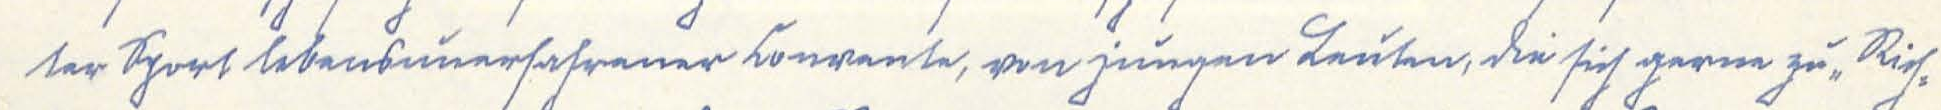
ter Sport lebensunerfahrener Convente, von jüngeren Leuten, die sich ganz zu "Rich-
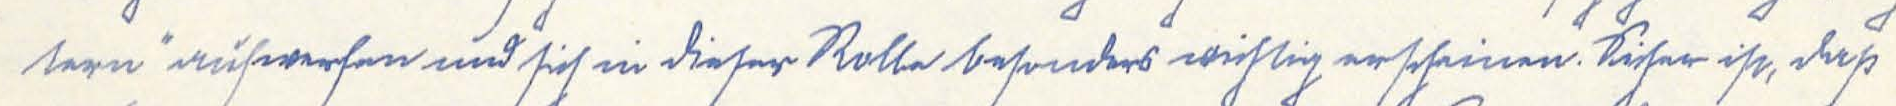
tern" aufwerfen und sich in dieser Rolle besonders wichtig erscheinen. Sicher ist, daß
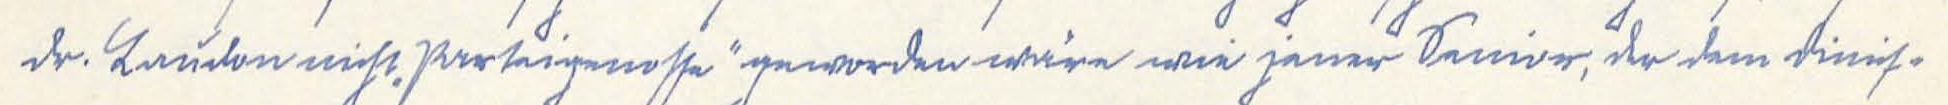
Dr. Laudon nicht "Parteigenosse" geworden wäre wie jener Senior, der dem dimis-
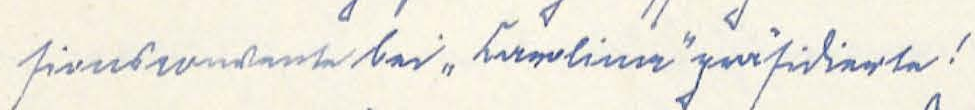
sionsconvente bei "Carolina" präsidierte!
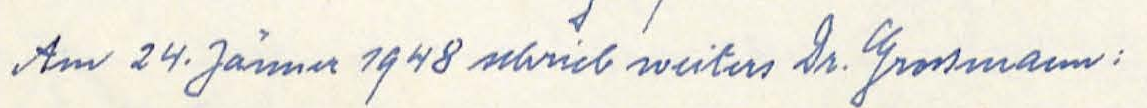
Am 24. Jänner 1948 schrien weiter Dr. Grossmann:
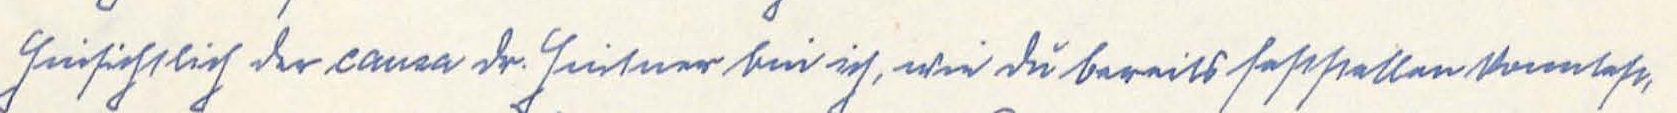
Hinsichtlich der causa Dr. Hintner bin ich, wie du bereits feststellen konntest,
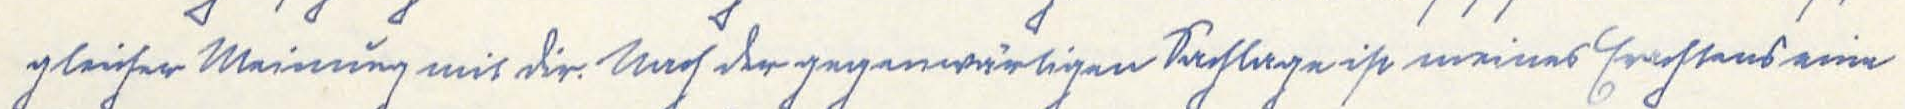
gleicher Meinung mit dir. Nach der gegenwärtigen Sachlage ist meines Erachtens eine
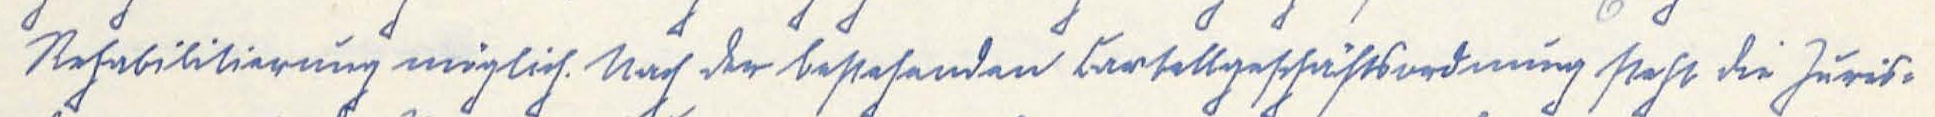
Rehabilitierung möglich. Nach der bestehenden Cartellgeschäftsordnung steht die Juris-
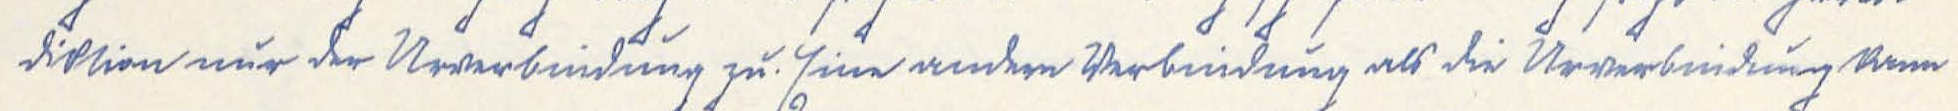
diktion nur der Urverbindung zu. Eine andere Verbindung als die Urverbindung kann
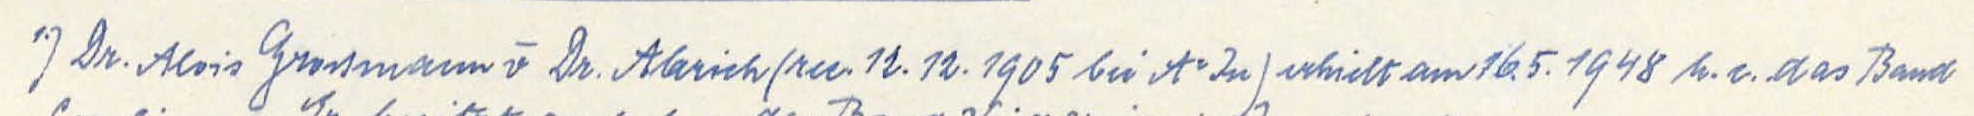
1.) Dr. Alois Grossmann v/o Dr. Alarich (rec. 12. 12. 1905 bei AIn) erhielt am 16. 5. 1948 h. c. das Band
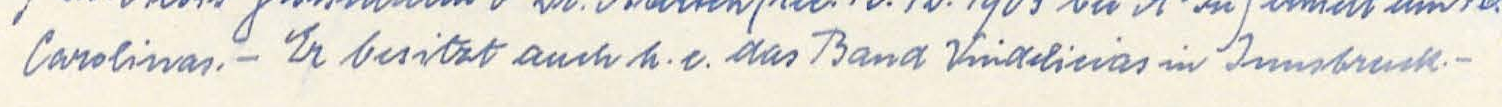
Carolinas.- Er besitzt auch h. c. das Band Vindelicias in Innsbruck.-
